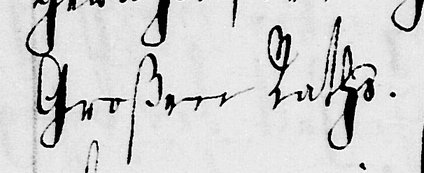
Großen Raths.
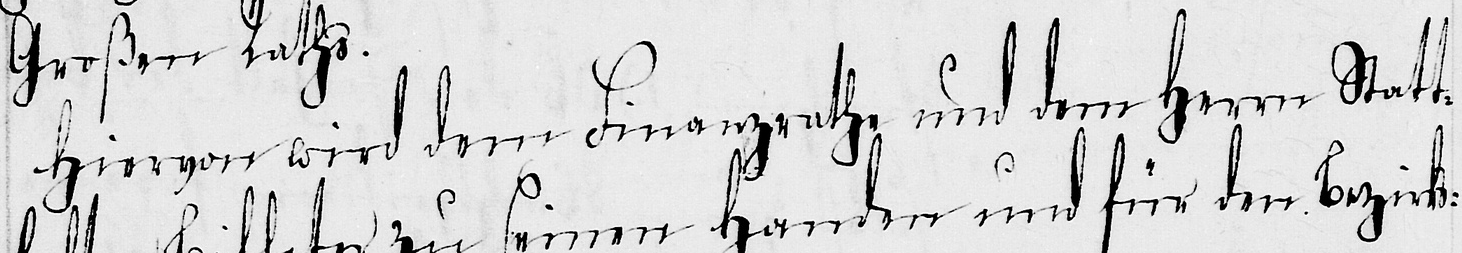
Hiervon wird dem Finanzrathe und dem Herrn Stat¬
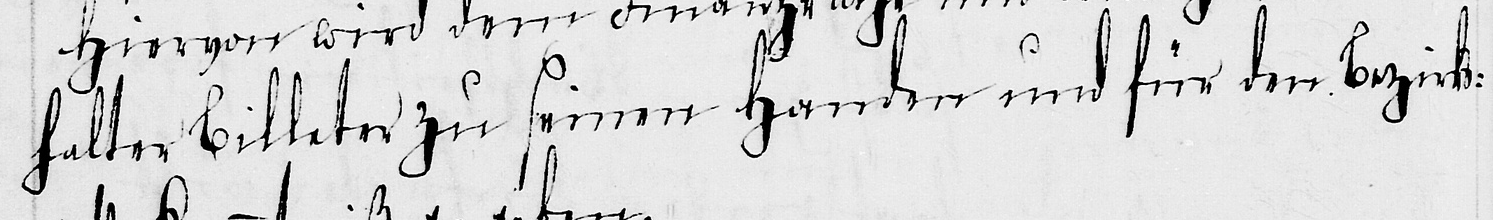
thalter Billeter zu seinen Handen und für den Bezirk¬
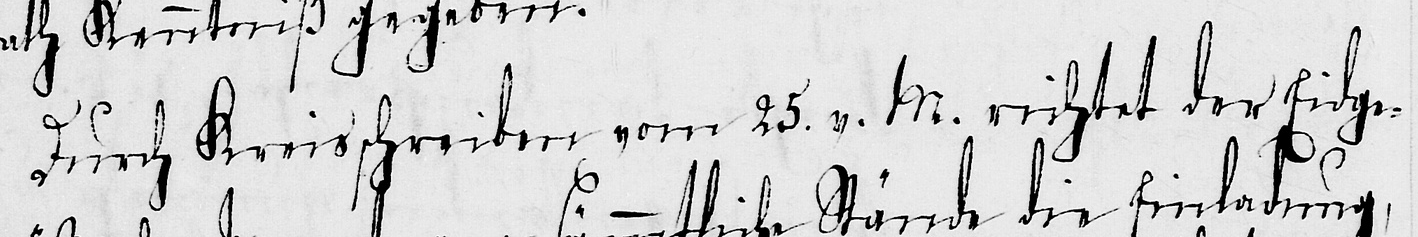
Durch Kreisschreiben vom 25. v. M. richtet der Eidge¬
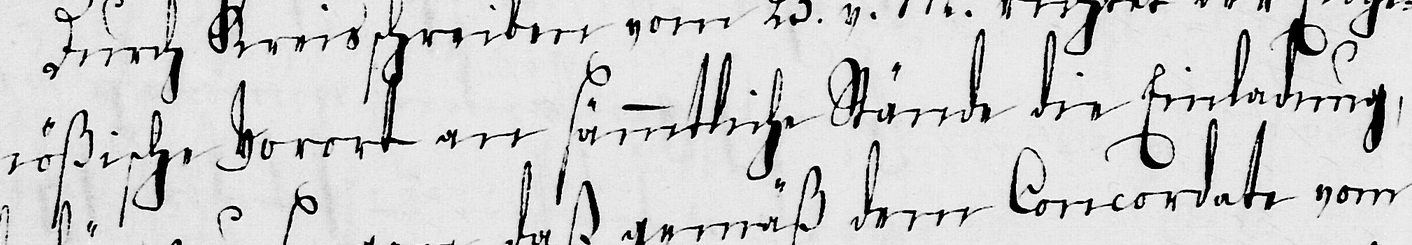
nößische Vorort an sämmtliche Stände die Einladung,
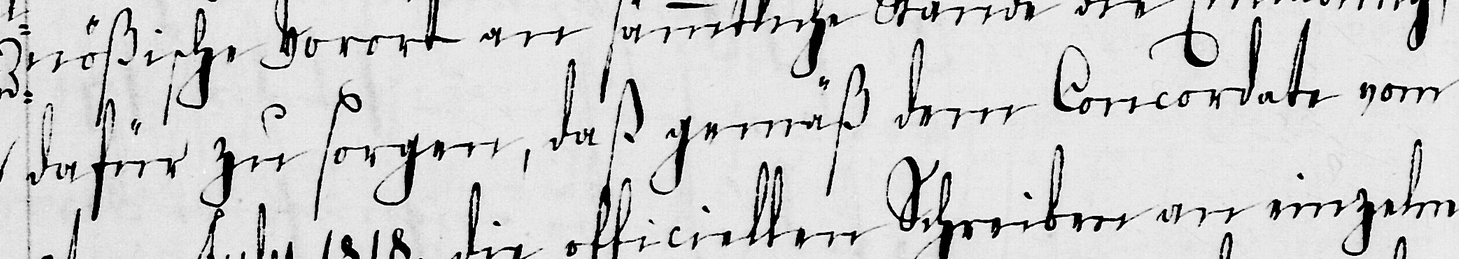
dafür zu sorgen, daß gemäß dem Concordate vom
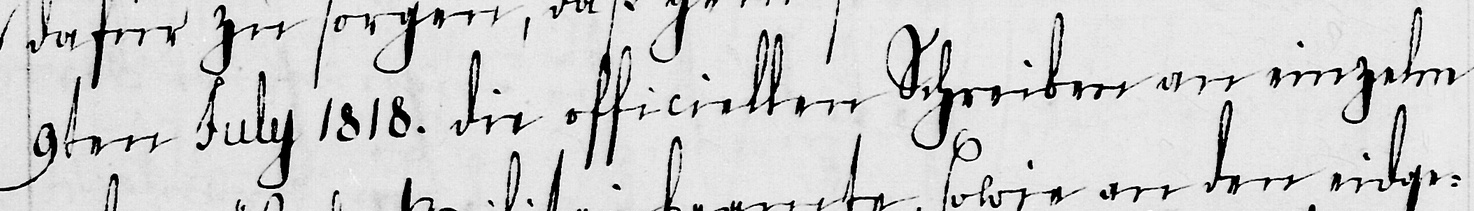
9ten July 1818. die officiellen Schreiben an einzelne
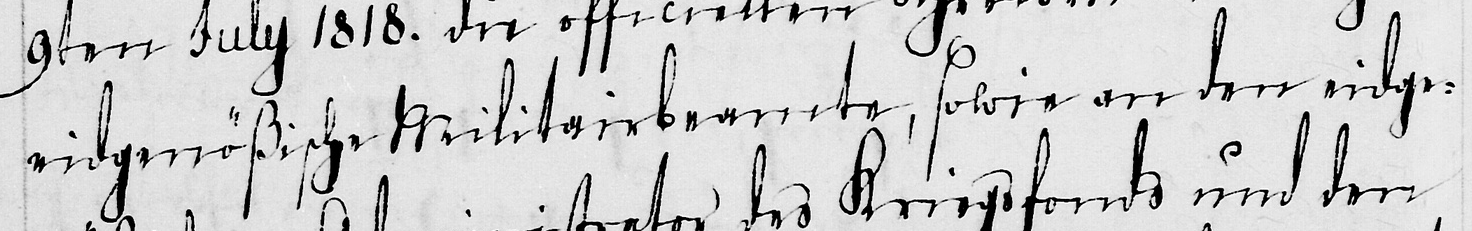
eidgenößische Militairbeamte, sowie an den eidge¬
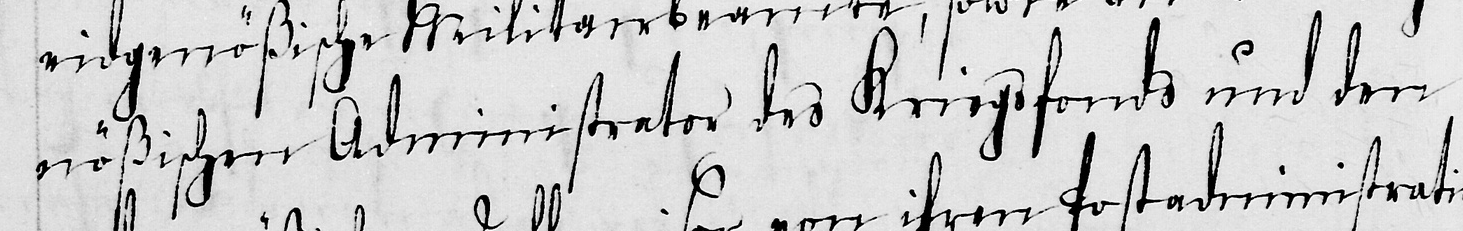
nößischen Administrator des Kriegsfonds und den
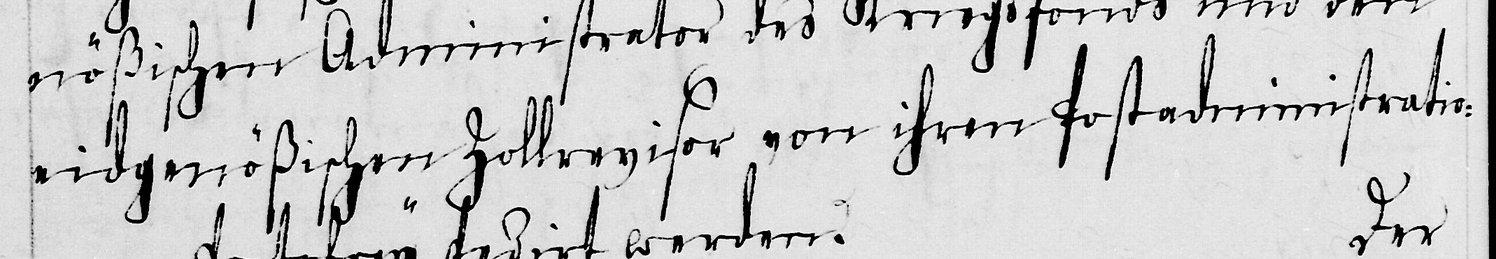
eidgenößischen Zollrevisor von ihren Postadministrati¬
